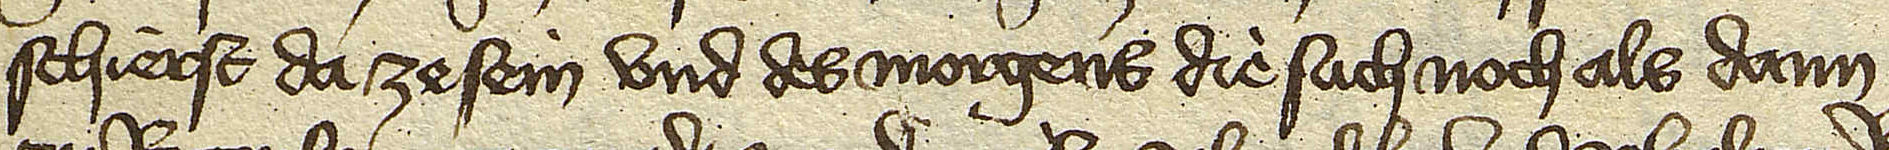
ſchierſt da cʒe ſein vnd des morgens die ſach noch als dann
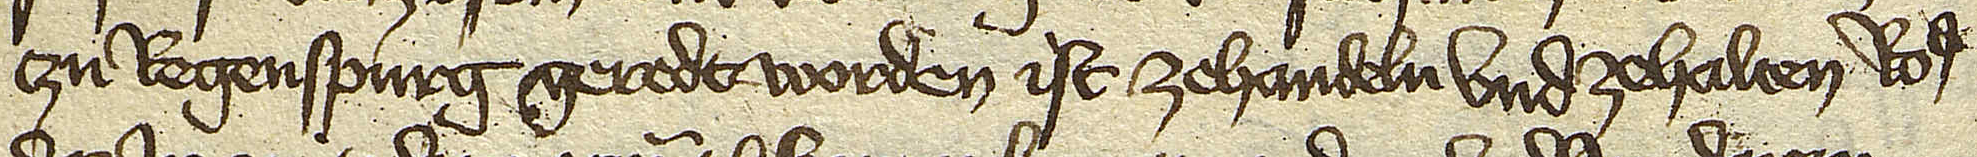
cʒu Regenſpurg geredt worden iſt cʒehandeln vnd cʒehalten Ro*
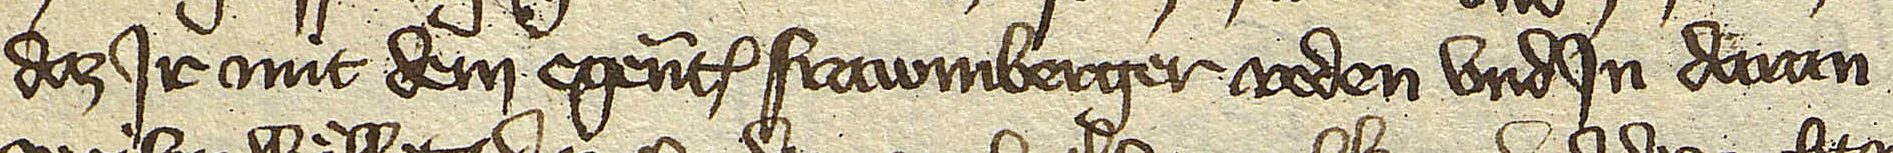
daʒ Ir mit dem egen*t* frawmberger reden vnd In daran
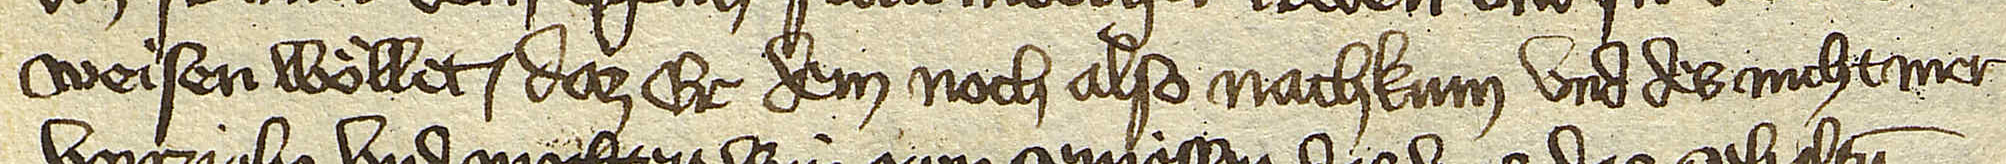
weiſen wöllet / daʒ Er dem noch alſo nachkum vnd des nicht mer
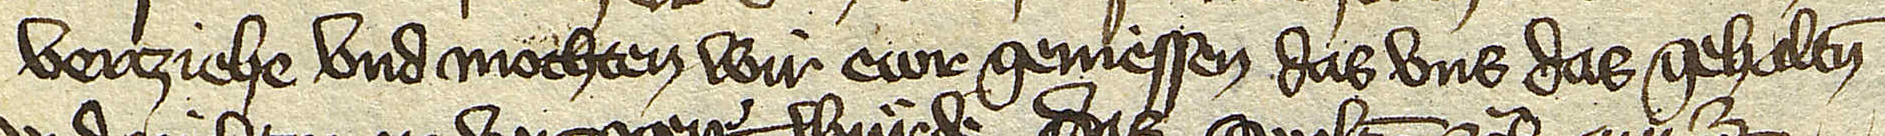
vercʒiehe vnd möchten wir ewr genieſſen das vns das gehaltn*
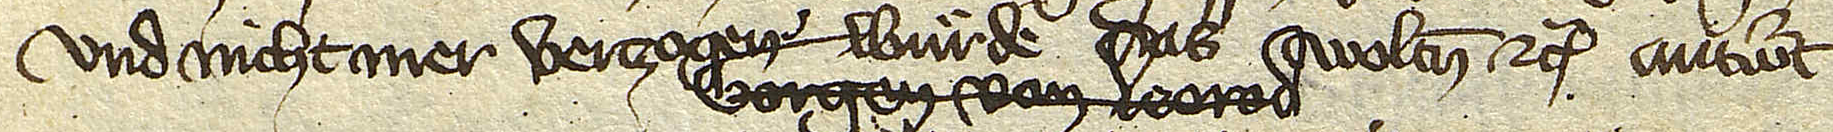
vnd nicht mer vercʒogen würde das woltn* ec* antwt*
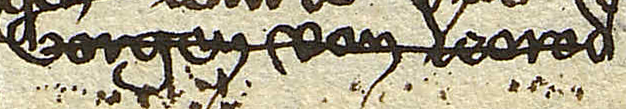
Görgen von leorod
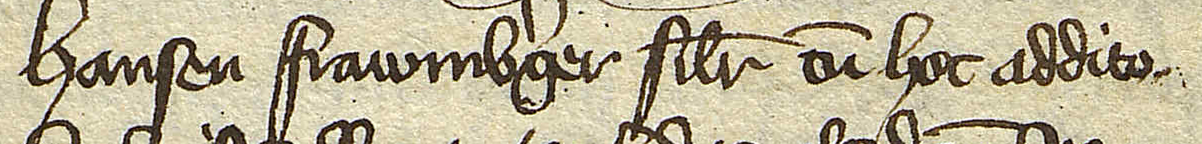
hanſen frawmb*ger ſilr* cu* hoc addito
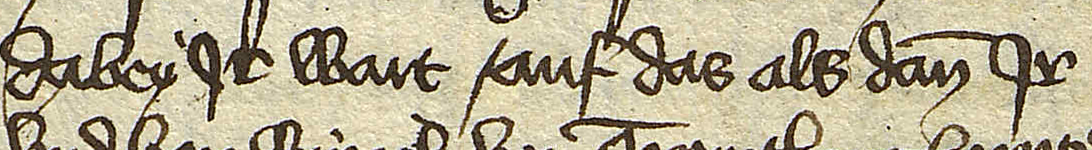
dabey Ir wart / auf das als dan* Ir
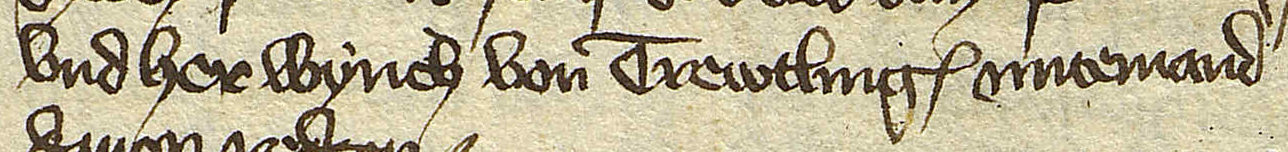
vnd her wyrich von Trewtling* miteinand*
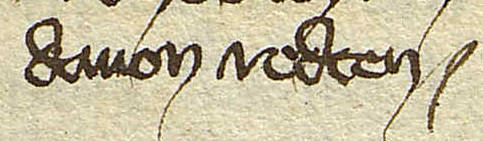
dauon redten /
